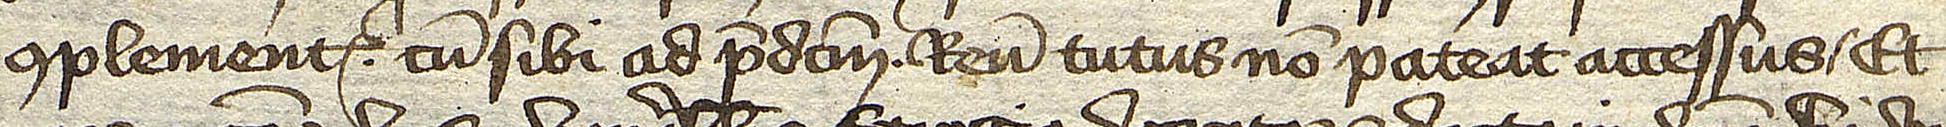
*plement* . cu* ſibi ad p*d*c*m . Reu* tutus no* pateat acceſſus / Et
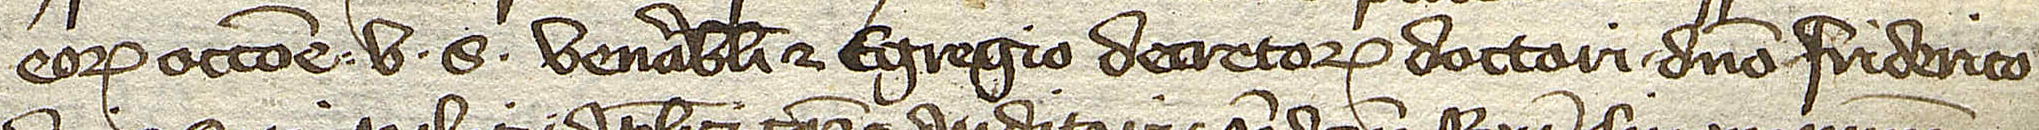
eo* occ*one . v . S . ven*ab*li @ Egregio decreto* doctori / d*no Friderico
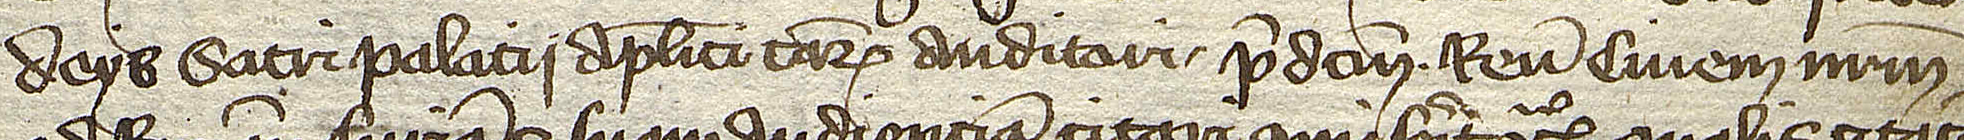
Deys Sacri palacii Ap*lici ca* Auditori / p*d*c*m . Reu* Ciuem n*r*m
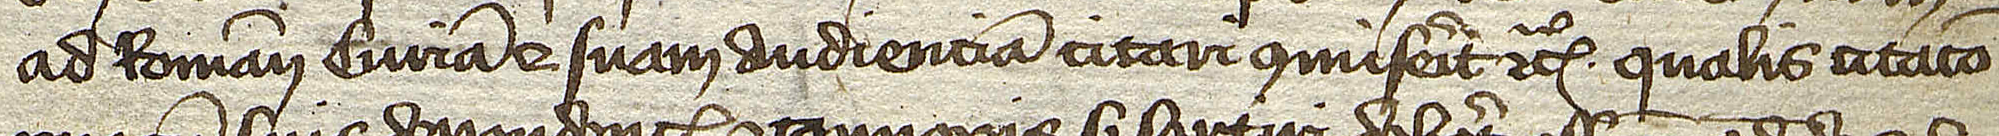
ad Roman* Curia* @ ſuam Audencia* citari *miſe*it ec* . qualis citac*o
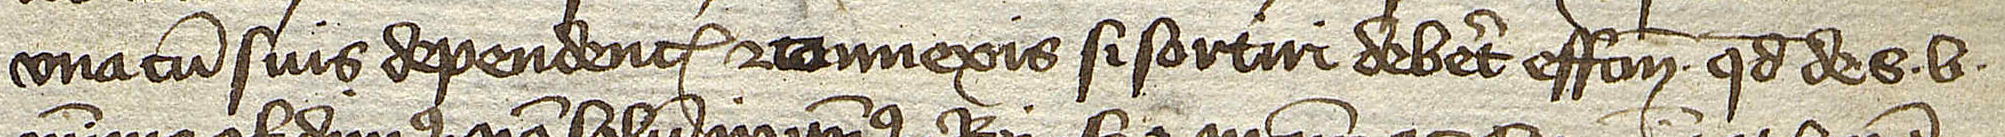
vna cu* ſuis dependent* @ annexis ſi ſortiri debet* eff*c*m . q*d* de S . v .
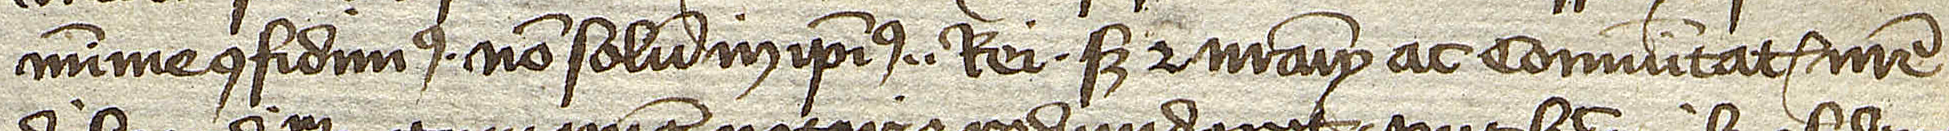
mi*me *fidim* . no* ſolu* in ip*i* . . Rei . ſ* @ n*ra* ac Com*u*itat* n*re
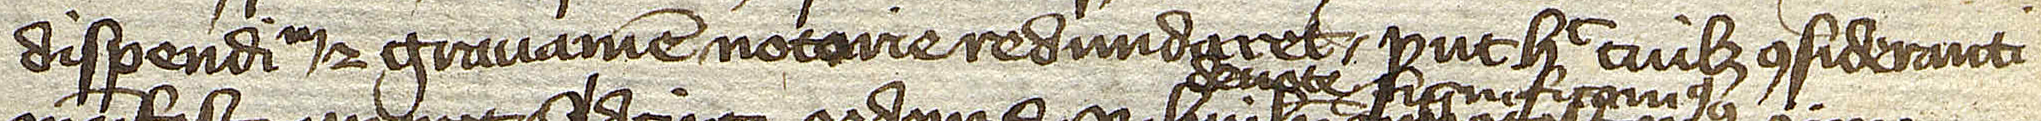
diſpendi* @ grauame* notorie redundaret / P*ut h* cuil* *ſideranti
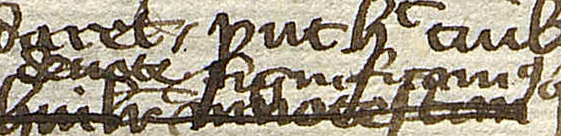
deuote ſignificam*
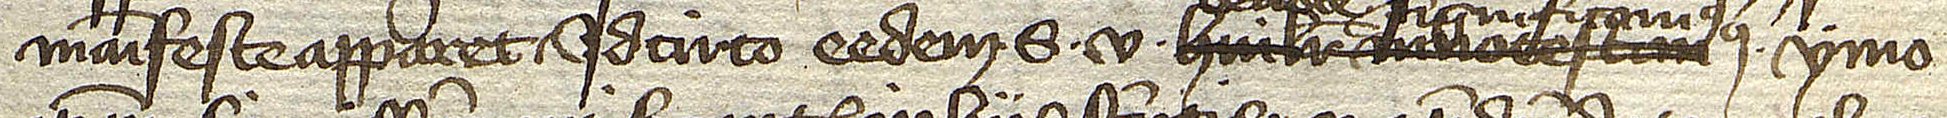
ma*ifeſte apparet / Idcirco eedem S . v . huilr* innoceſtim* ymo
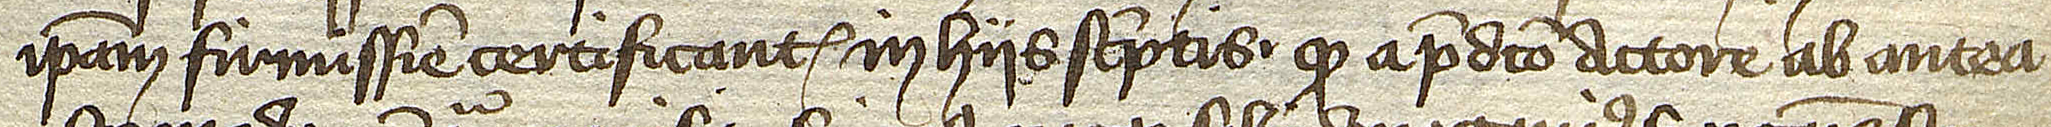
ip*am firmiſſi*e certicifant* in hiis ſc*ptis q* ap*d*c*o Actore ab antea
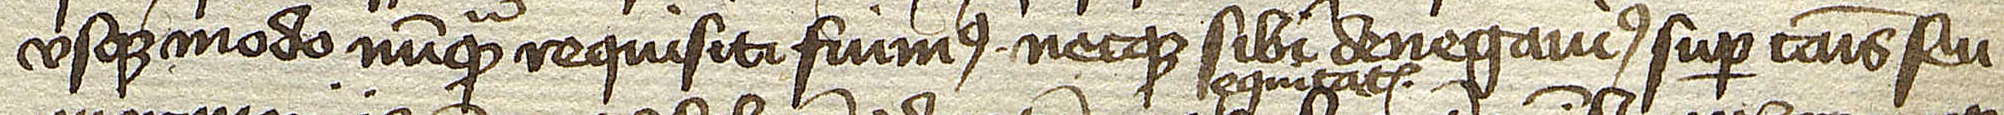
uſq* modo nu*q* requiſiti fuim* necq* ſibi denegaui* ſup* ca*is ſeu
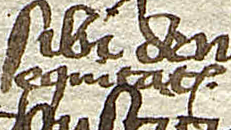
equitat*
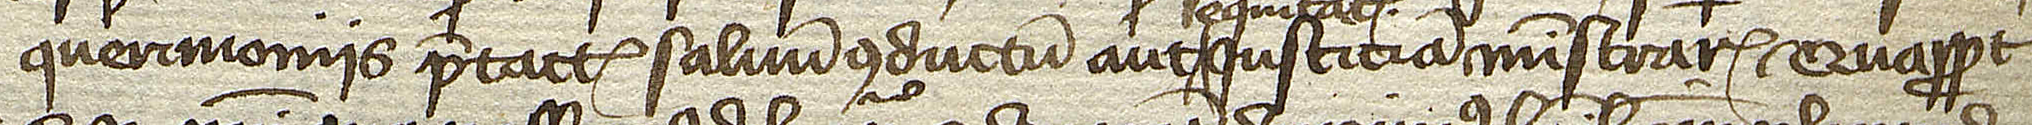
querimoniis p*tact* ſaluu* *ductu* aut Iuſticia* mi*ſtrar* / Quap*pt*
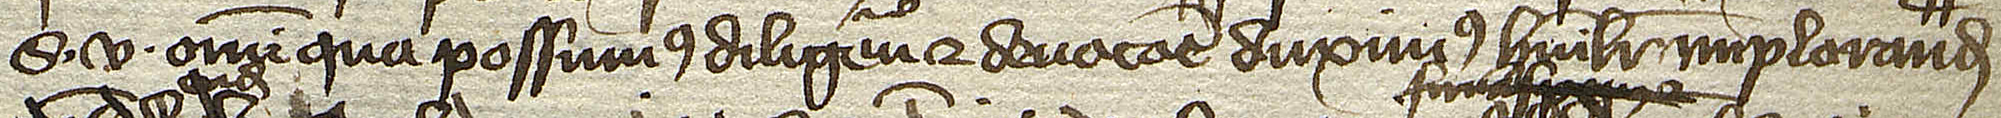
S . v . om*i qua poſſum* diligen* @ deuoc*o*e* duxim* hu*il*r implorand*
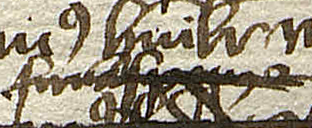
%%%%%%%
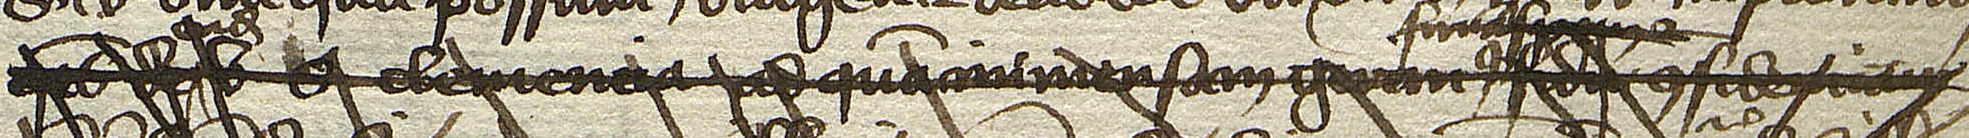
%%% de v . S . clemencia ad qua* i%%%enſam geram* fid%* *fidencia%*
